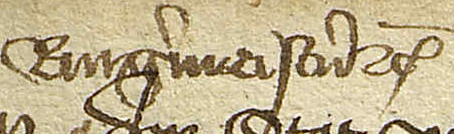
Burg*meiſtn* ec*
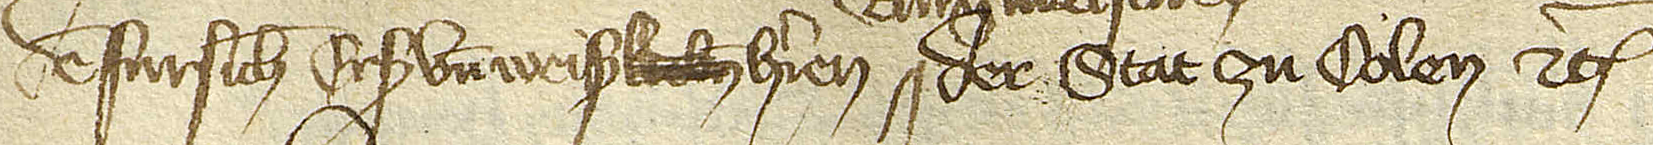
De* furſich* Erſ* vn* weiſ*lichn* h*ren der Stat cʒu Cölen ec*
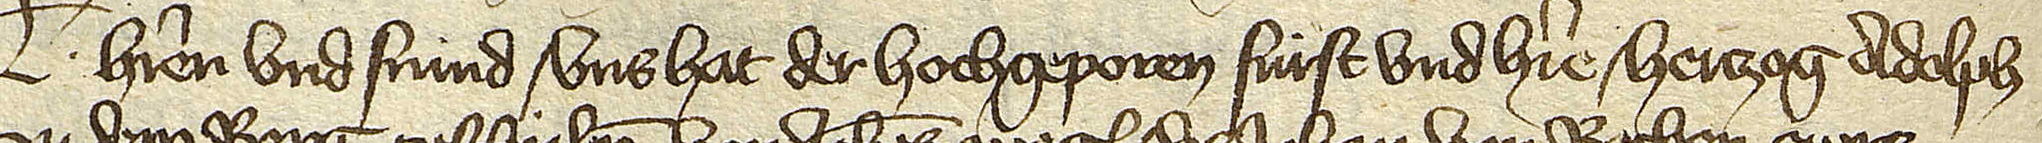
L* hr*en vnd frund / vns hat der hochgeporen fürſt vnd h*re / hercʒog Adolph
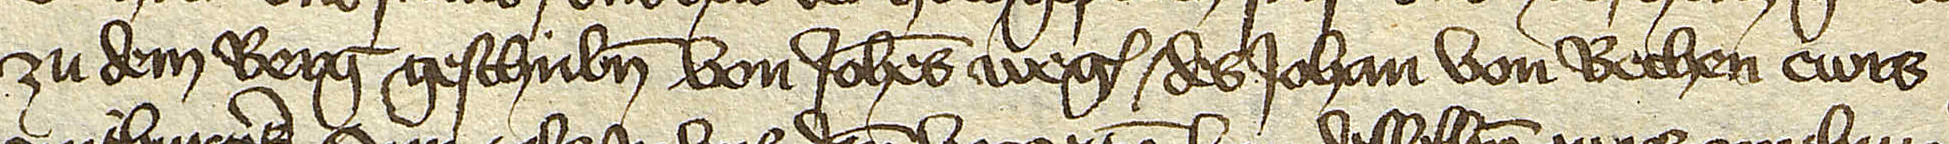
cʒu dem Berg geſchribn* von Iohes* weg* / des Iohan von Bechen ewrs
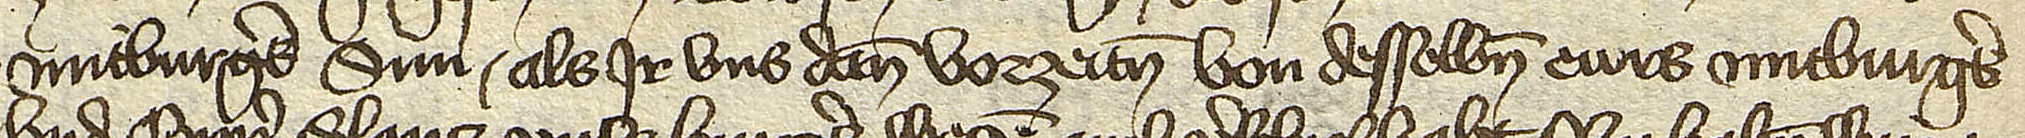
mitburgs* Sun / als Ir vns dan* vorcʒeitn* von deſſelbn* ewrs mitburgs*
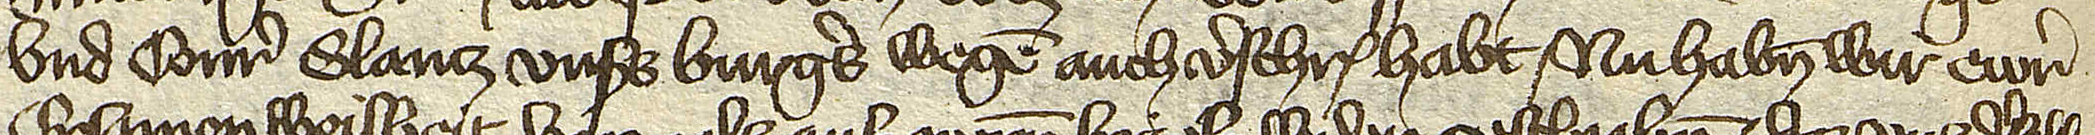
vnd Conr* Slancʒ vnſ*s burgs* wege* auch v*ſchr* habt / Nu habn* wir ewr*
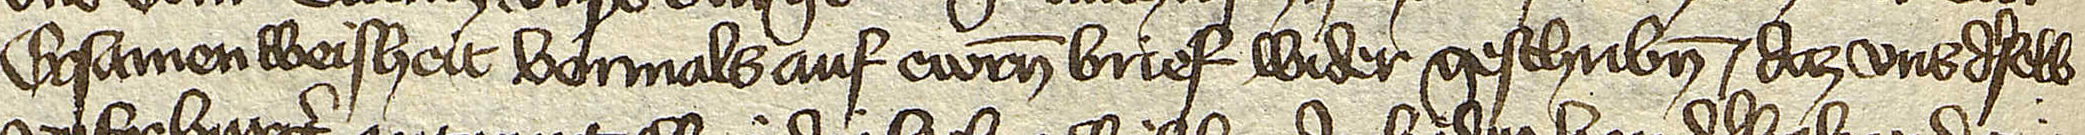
Erſamen weiſheit vormals auf ewrn* brief wider geſchribn* / daʒ vns d*ſelb
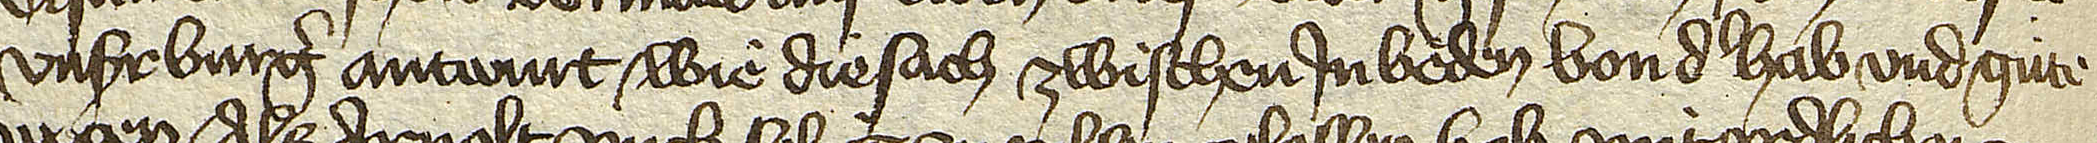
vnſ*r burg* antwurt / wie die ſach cʒwiſchen In beden von d* hab vnd güte
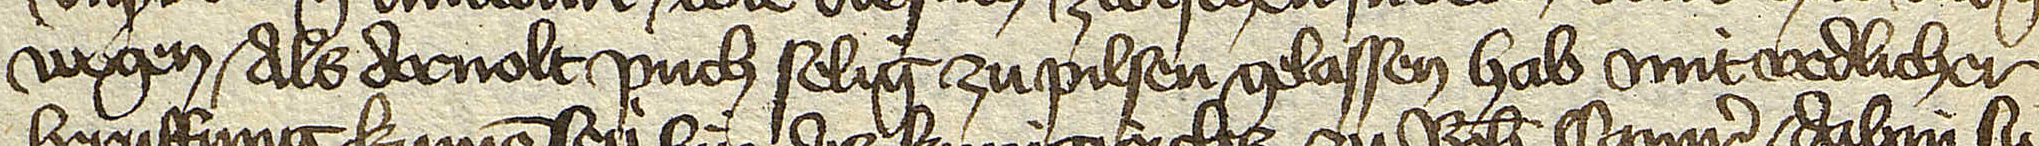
wegen / Als Arnolt puch ſelig cʒu pilſen gelaſſen hab mit redlicher
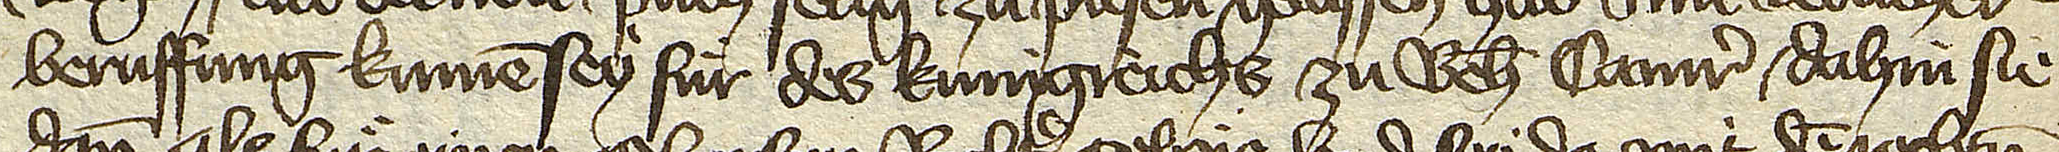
beruffung kume* ſey für des kunigreichs cʒu Beh* Camr* / dahin ſie
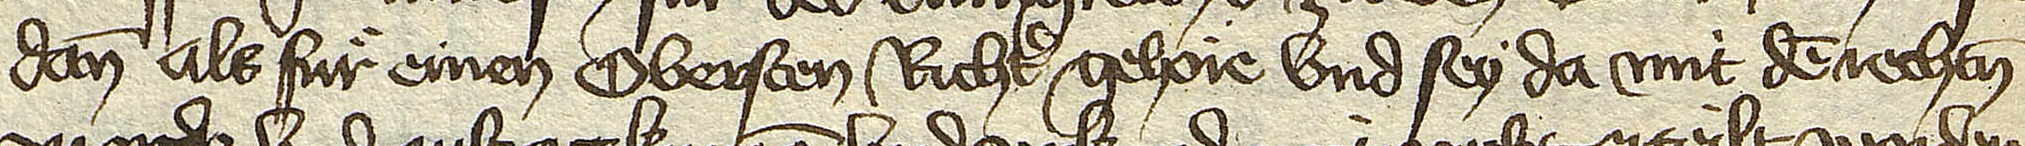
dan* als für einen Oberſten Richt* gehöre vnd ſey da mit de* rechtn*
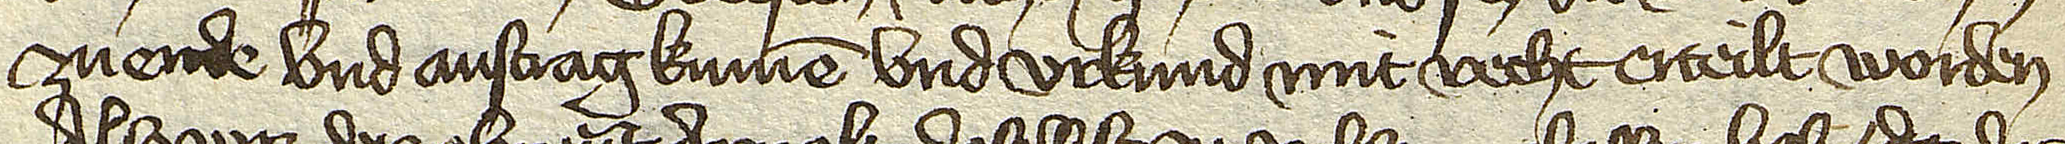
cʒu ende vns auſtrag kume* vnd vrkund mit recht erteilt worden
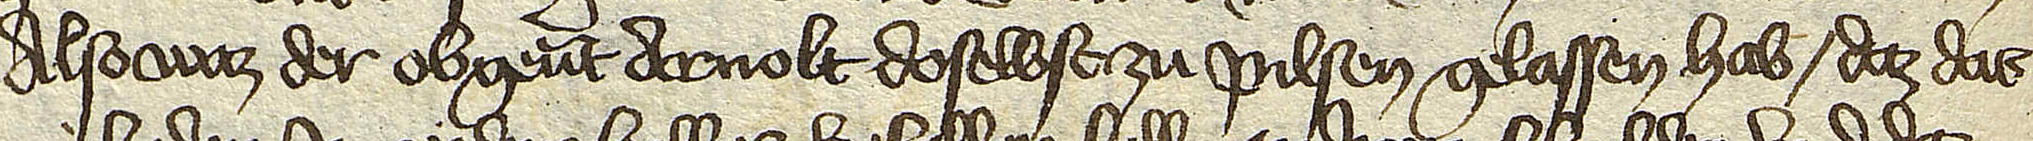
Alſo waʒ der obgent* Arnolt doſelbſt cʒu Pilſen gelaſſen hab / daʒ das
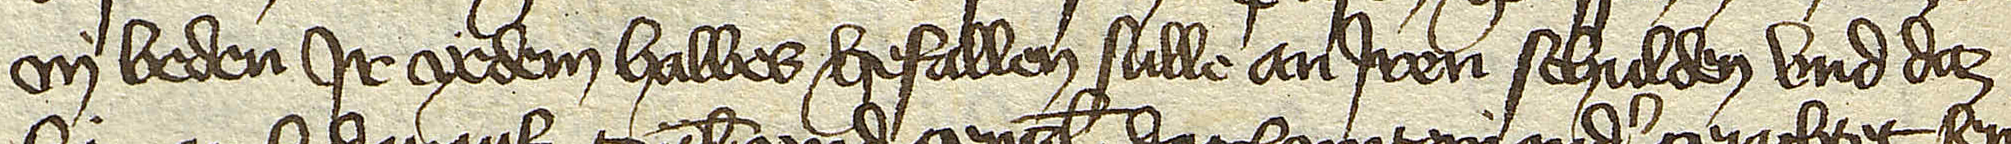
in beden Ir yedem halbes gefallen ſulle an Iren ſchulden vnd daʒ
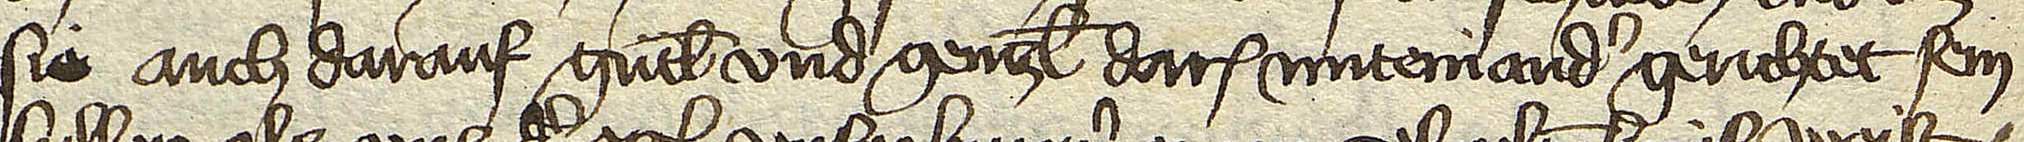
ſie auch darauf gütl* vnd gencʒl* dan* miteinand* gerichtet ſein
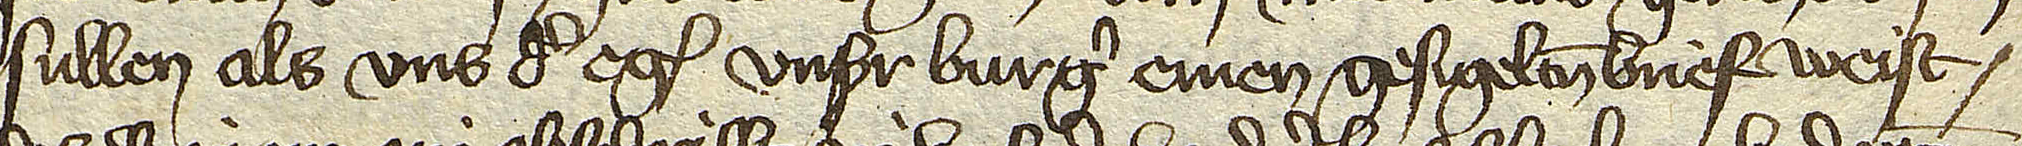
ſullen als vns d* eg* vnſ*r burg* einen geſigeltn* brief weiſt /
